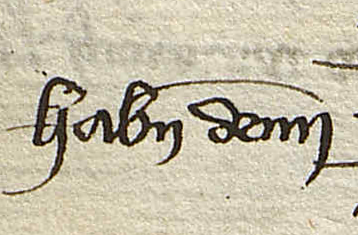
habn* denn
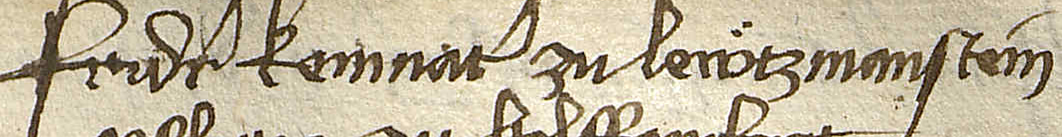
Fridr* kemnat* ʒu leẅcʒmanſtein
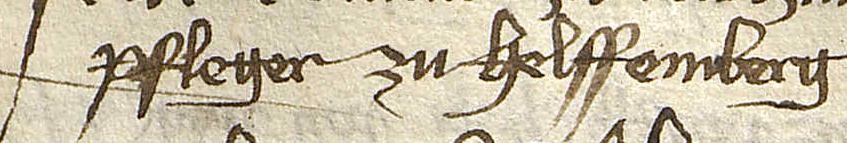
pfleger ʒu helffemberg
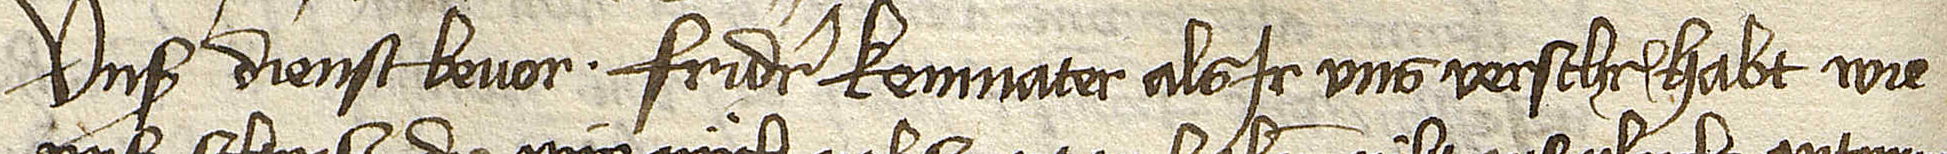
Vnſ* dienſt beuor . Fridr* Kemnater als Ir vns verſchr* habt wie
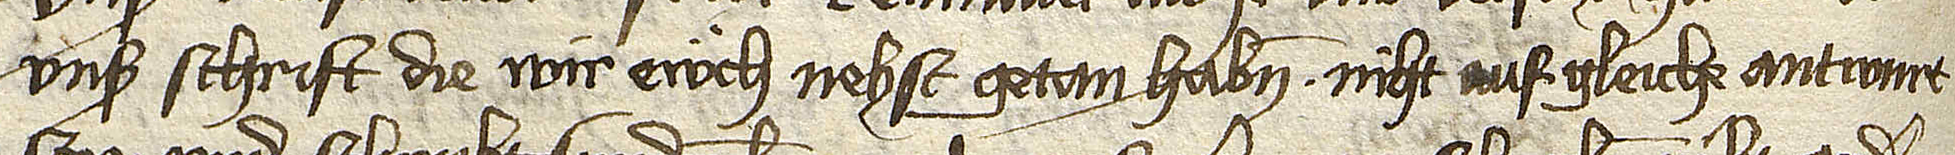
vnſ* ſchrift die wir eẅch nehſt getan habn* . niht auf gleiche antwurt
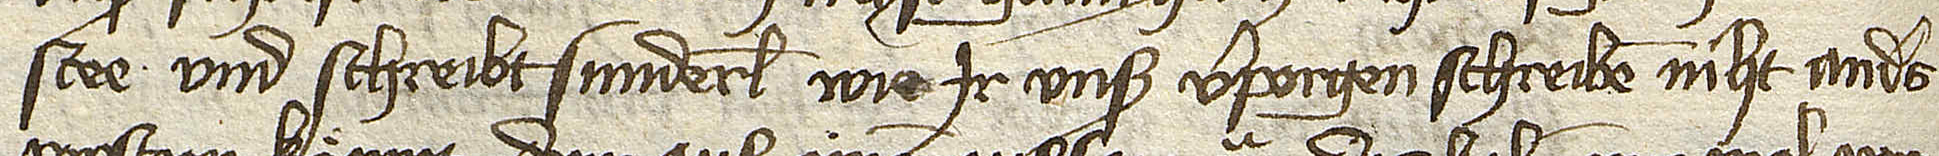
ſtee . vnd ſchreibt ſunderl* wie Ir vnſ* v*porgen ſchreibe* niht and*s
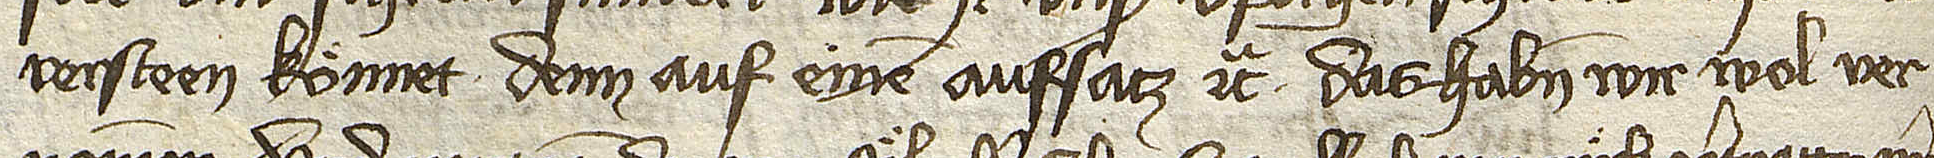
verſteen könnet . Denn auf eine* aufſacʒ ec* / Das habn* wir wol ver
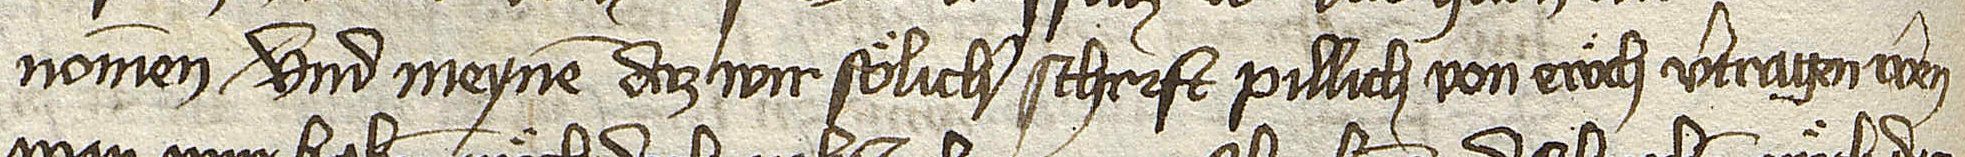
nom*en / Vnd meyne* daʒ wir ſölich* ſchrift pillich von eẅch v*tragen w*en
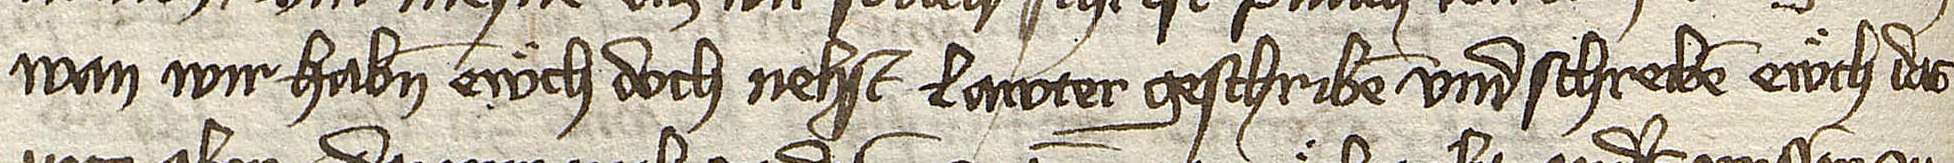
wan wir habn* eẅch doch nehſt lawter geſchribe* vnd ſchreibe* eẅch das
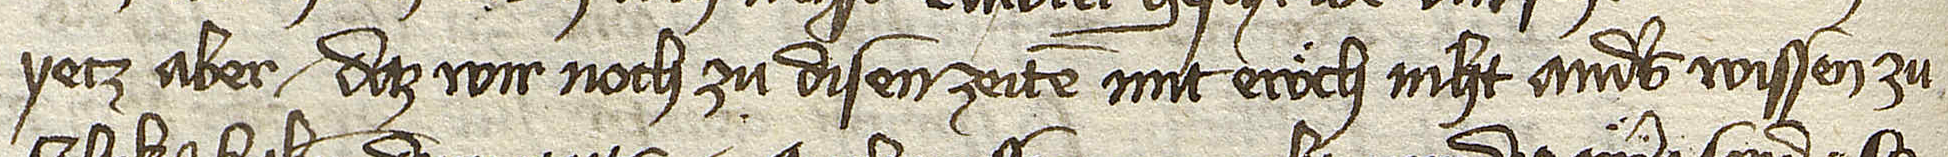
yecʒ aber / Daʒ wir noch ʒu diſen ʒeite* mit eẅch niht and*s wiſſen ʒu
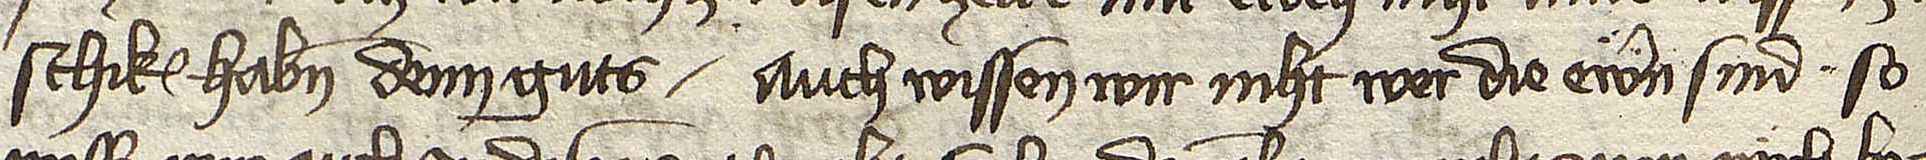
ſchik* habn* denn guts / Auch wiſſen wir niht wer die eẅ*n ſind . ſo
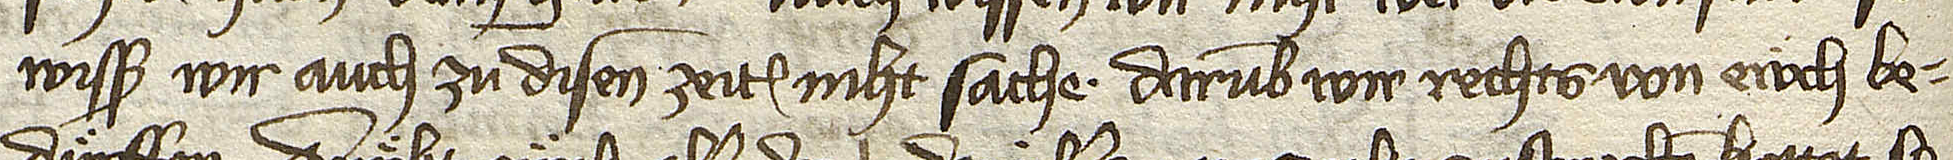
wiſſ* wir auch ʒu diſen ʒeit* niht ſache . darub* wir rechts von eẅch be =
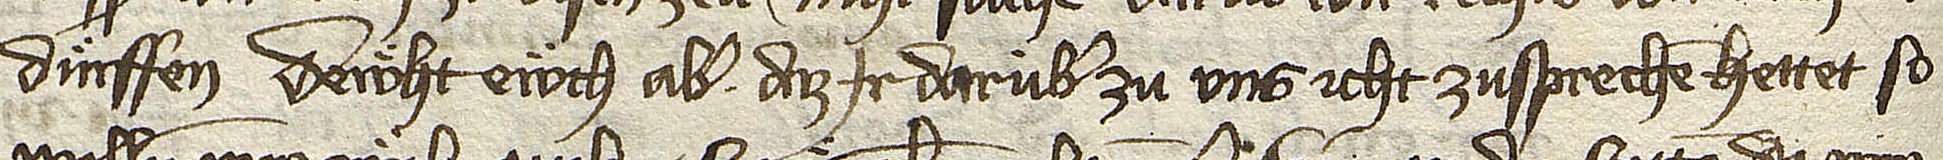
dürffen Deẅht eẅch ab* . daʒ Ir darüb* ʒu vns icht ʒuſpreche* hettet ſo
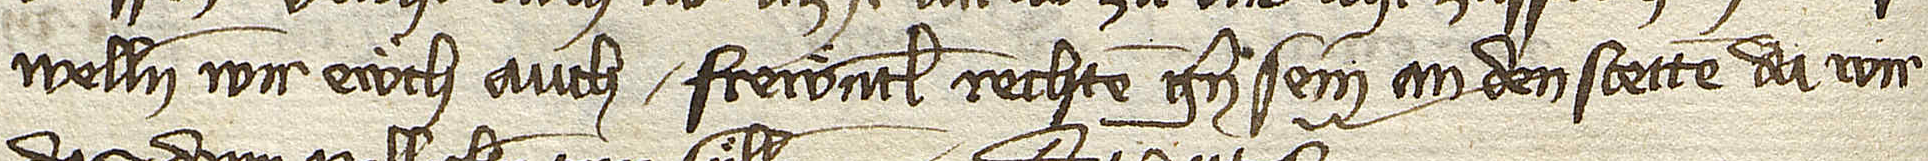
welln* wir eẅch auch / freẅntl* rechte* g*n ſein an den ſtette* da wir
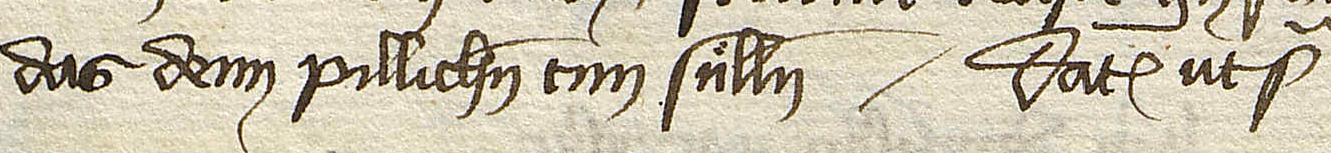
das denn pillichn* tun ſülln* / Dat* ut ſ*
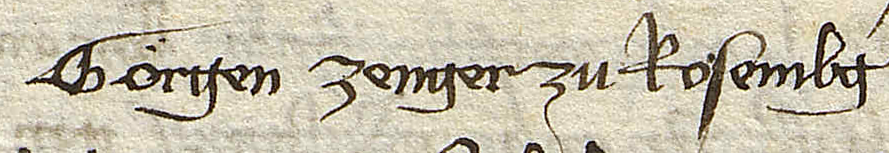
Görgen ʒenger ʒu Roſemb*g
